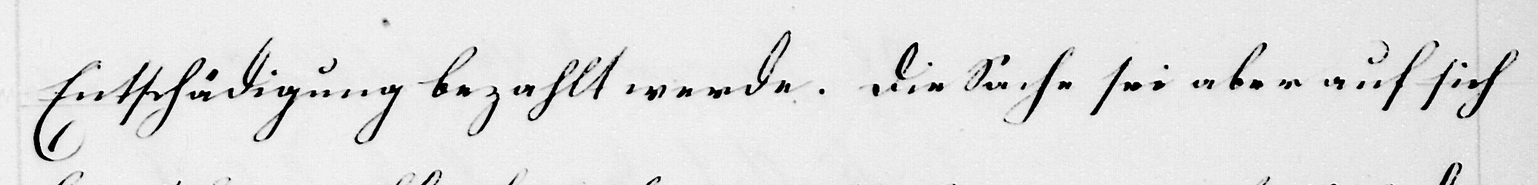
Entschädigung bezahlt werde. Die Sache sei aber auf sich
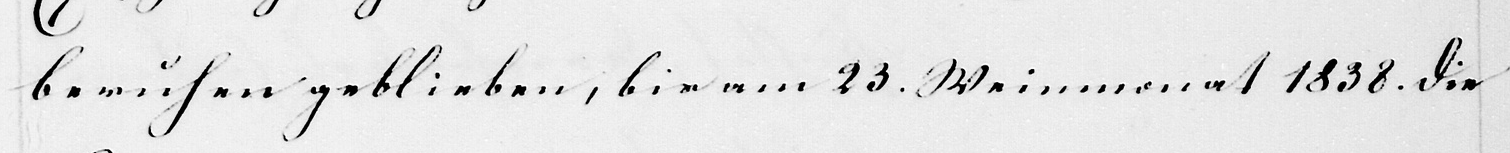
beruhen geblieben, bis am 23. Weinmonat 1838. die
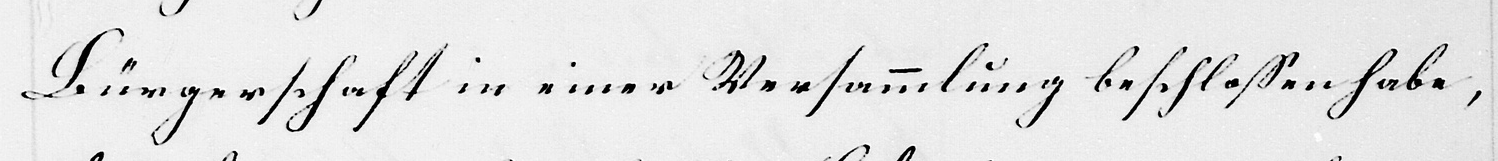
Bürgerschaft in einer Versammlung beschloßen habe,
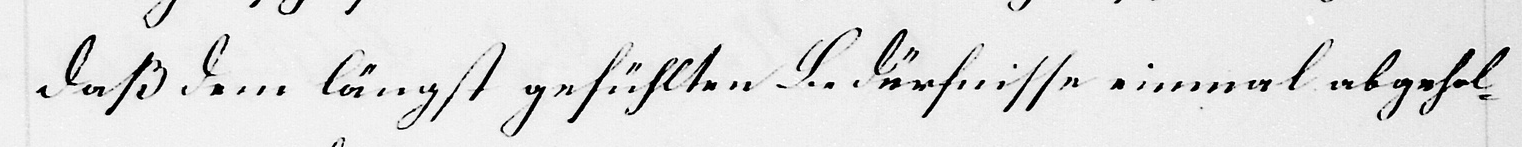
daß dem längst gefühlten Bedürfnisse einmal abgehol¬
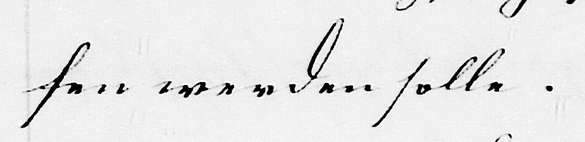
fen werden solle.
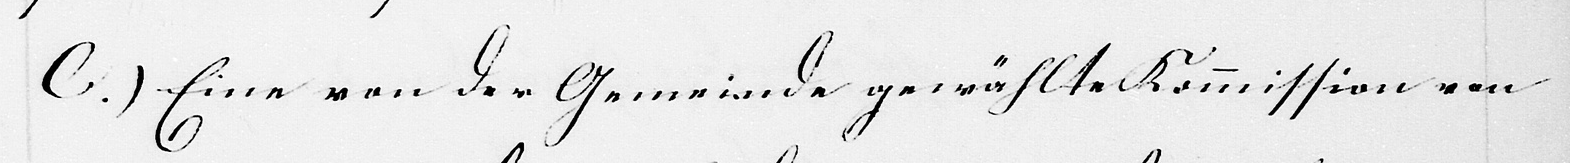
C.) Eine von der Gemeinde gewählte Kommission von
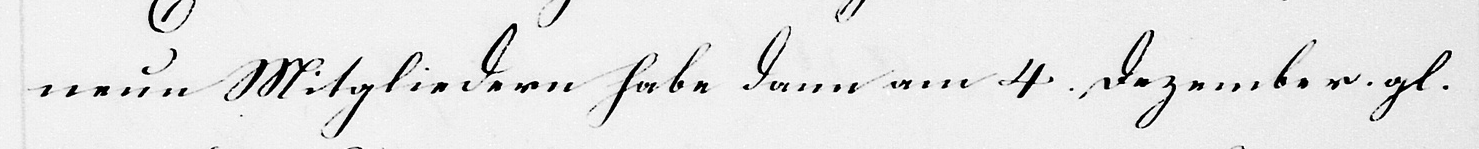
neun Mitgliedern habe dann am 4. Dezember. gl.
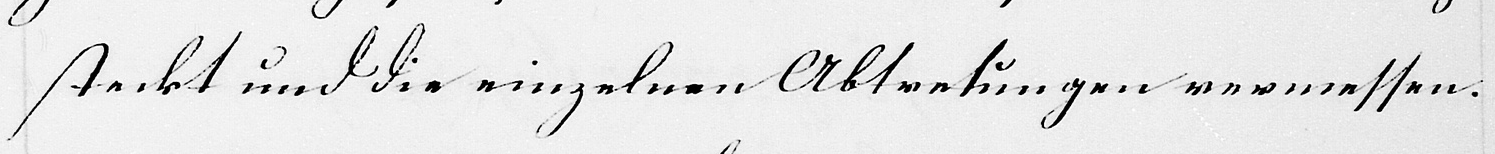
steckt und die einzelnen Abtretungen vermessen.
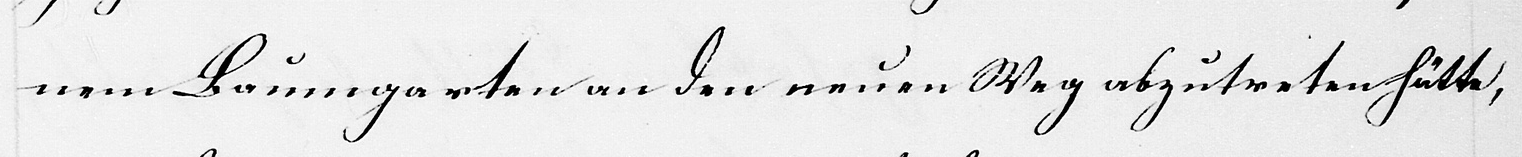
nem Baumgarten an den neuen Weg abzutreten hätte,
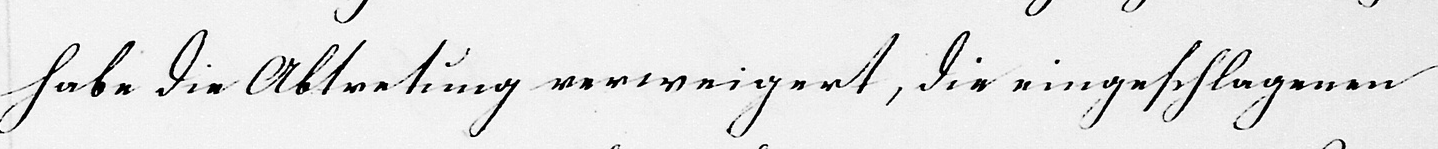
habe die Abtretung verweigert, die eingeschlagenen
